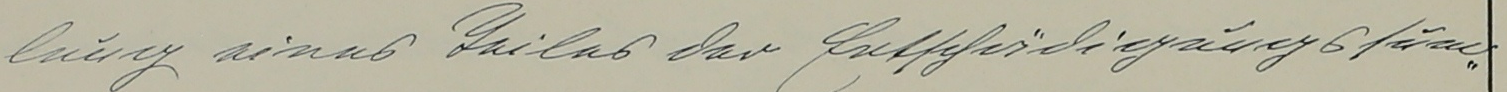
lung eines Teiles der Entschädigungssum-
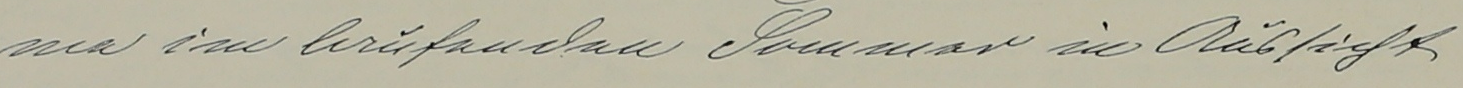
me im laufenden Sommer in Aussicht
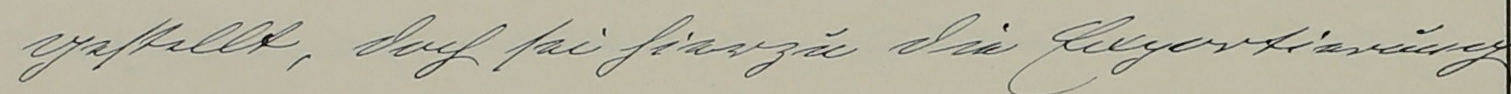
gestellt, doch sei hierzu die Exportierung
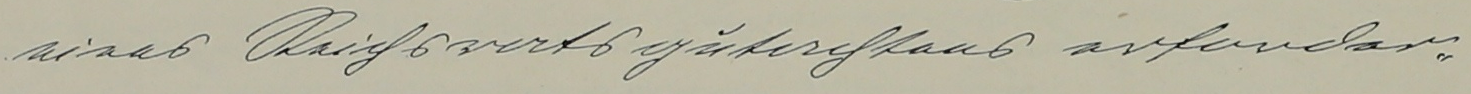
eines Reichsratsgutachtens erforder-
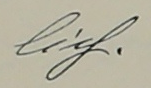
lich.
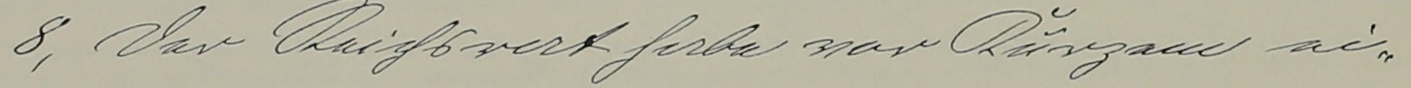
8. Der Reichsrat habe vor Kurzem ei-
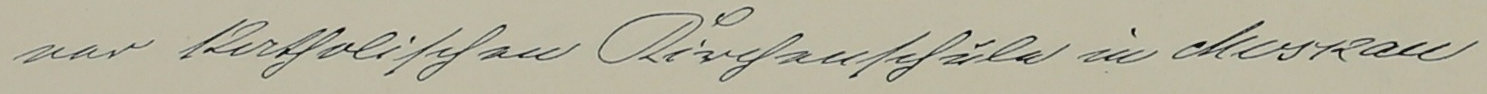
ner katholischen Kirchenschule in Moskau
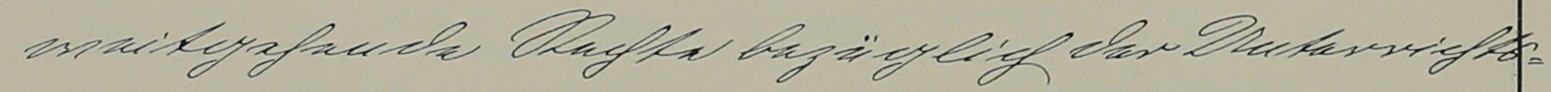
weitgehende Rechte bezüglich der Unterrichts-
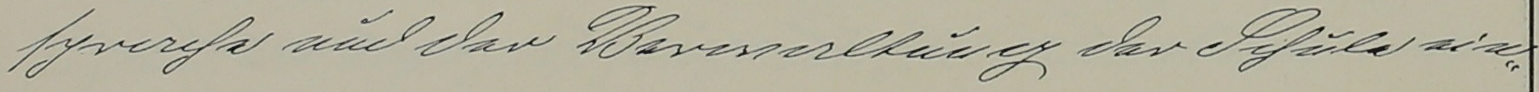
sprache und der Verwaltung der Schule ein-
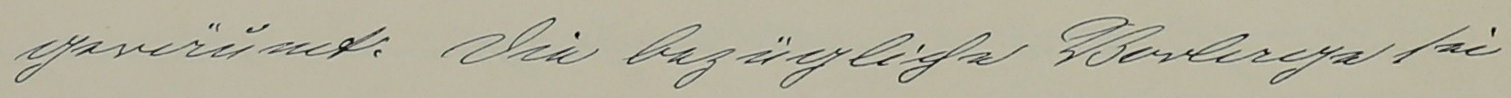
geräumt. Die bezügliche Vorlage sei
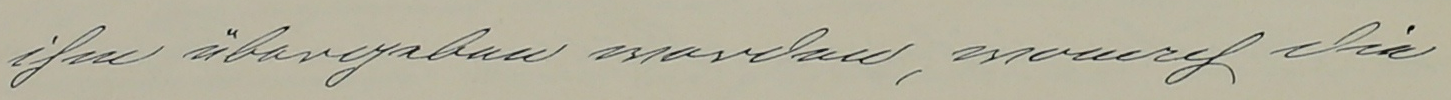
ihm übergeben worden, worauf die
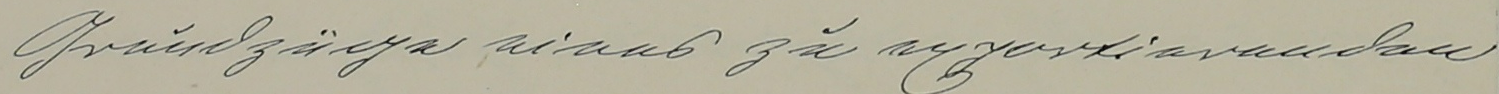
Grundzüge eines zu exportierenden
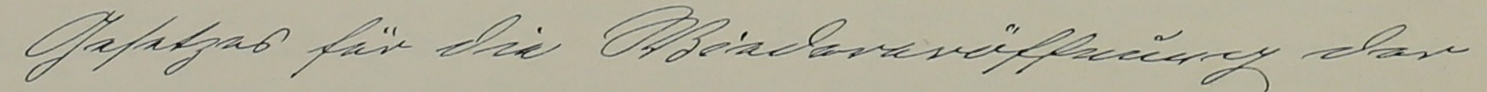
Gesetzes für die Wiedereröffnung der
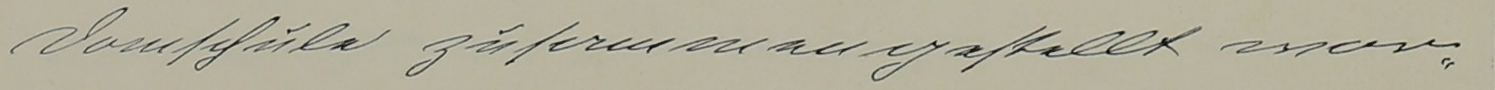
Domschule zusammengestellt wor-
